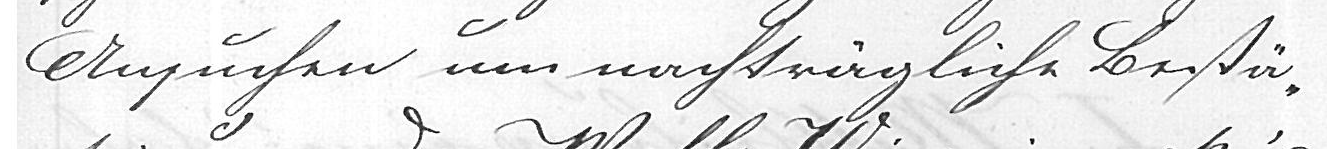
Ansuchen um nachträgliche Bestä-
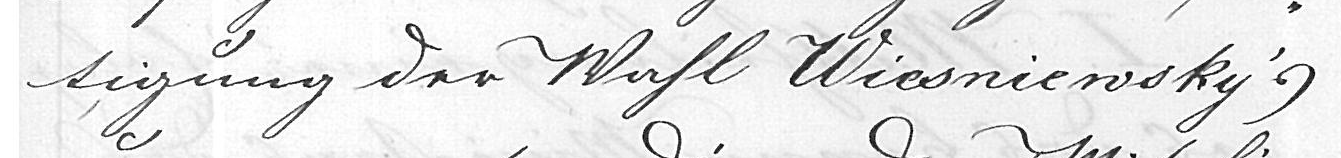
tigung der Wahl Wiesniewsky's
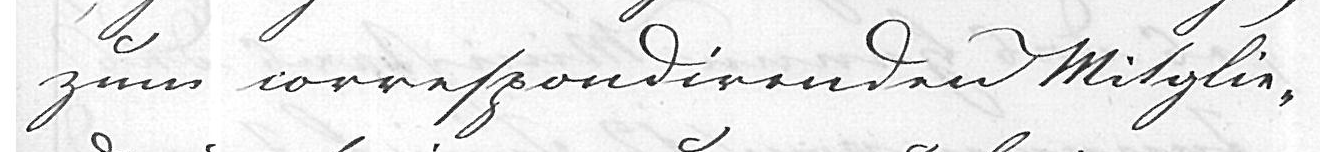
zum correspondirenden Mitglie-
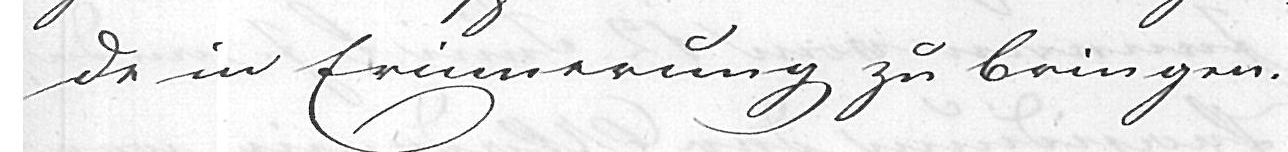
de in Erinnerung zu bringen.
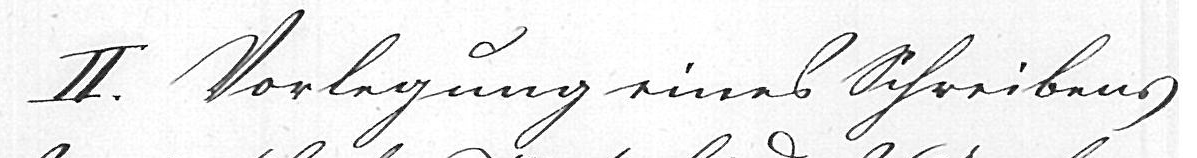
II. Vorlegung eines Schreibens
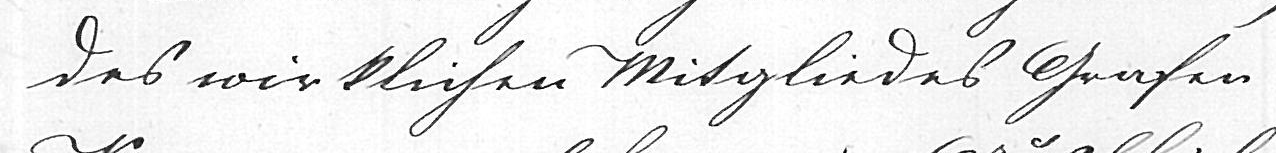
des wirklichen Mitgliedes Grafen
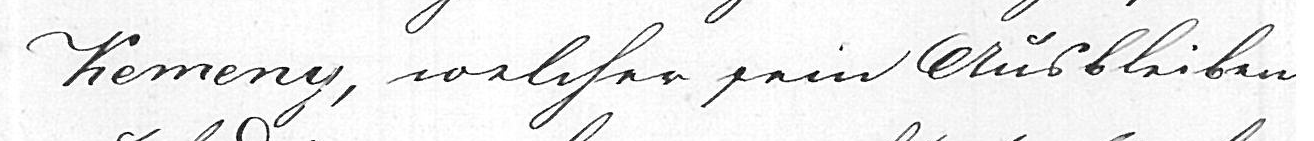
Kemeny, welcher sein Ausbleiben
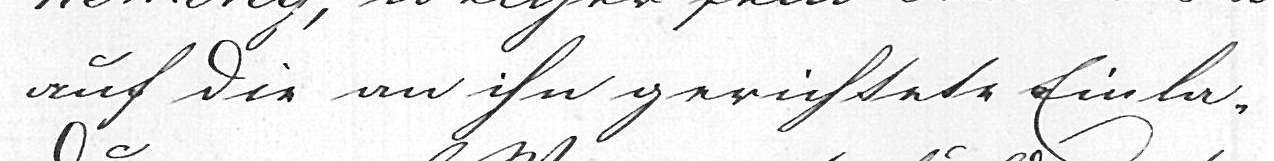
auf die an ihn gerichtete Einla-
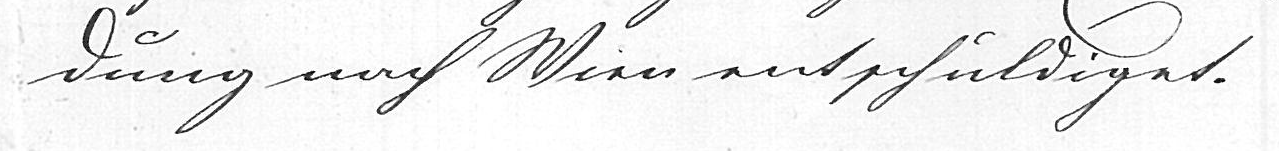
gung nach Wien entschuldiget.
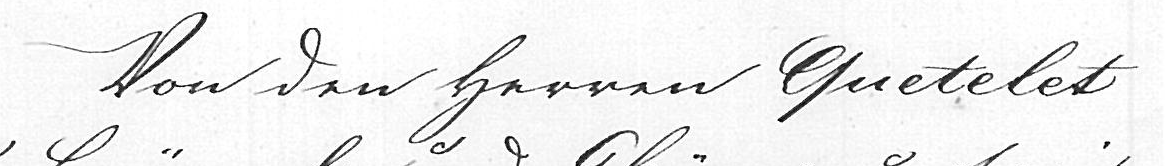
Von den Herren Quetelet
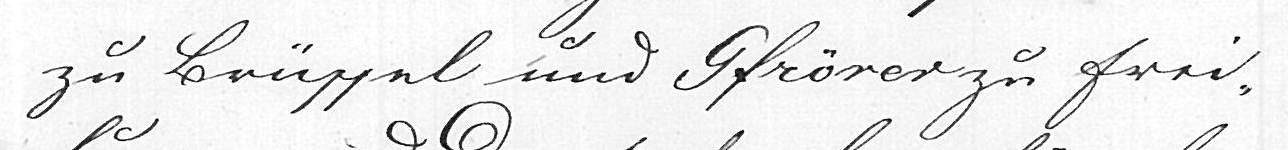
zu Brüssel und Gfrörer zu Frei-
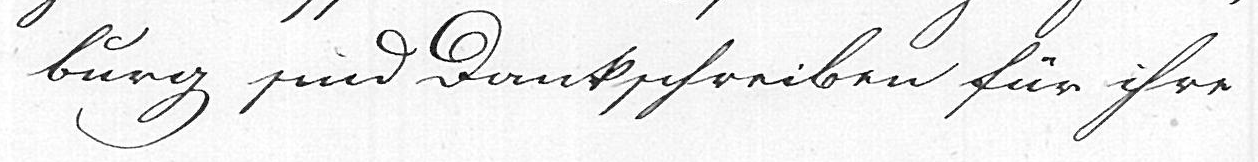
burg sind Dankschreiben für ihre
